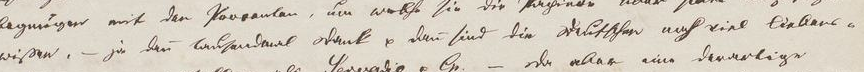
wißen. – ja dann tausendmal Dank & dann sind die Deutschen auch viel liebens-
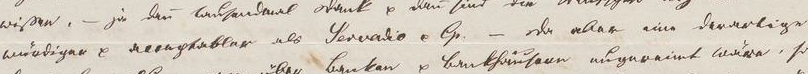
würdiger & acceptabler als Servadio & Cp. – oder aber eine derartige
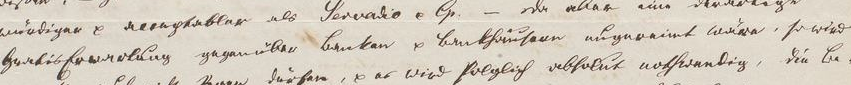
GratisErwartung gegenüber Banken & Bankhäusern ungereimt wäre, so wird
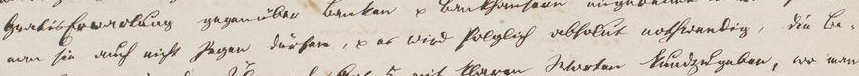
man sie auch nicht hegen dürfen, & es wird folglich absolut nothwendig, die Be-
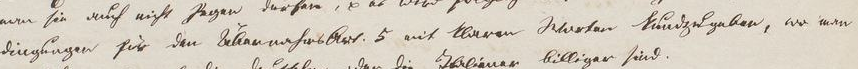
dingungen für den ÜbernahmsArt. 5 mit klaren Worten kundzugeben, wo man
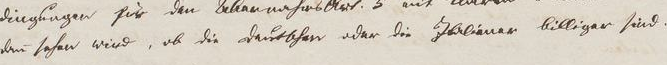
dann sehen wird, ob die Deutschen oder die Italiener billiger sind.
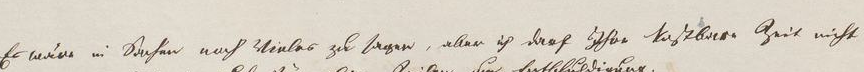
Es wäre in Sachen noch Vieles zu sagen, aber ich darf Ihre kostbare Zeit nicht
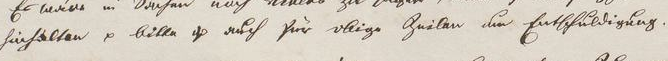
hinhalten & bitte ... auch für obige Zeilen um Entschuldigung.
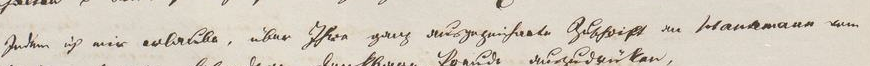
Indem ich mir erlaube, über Ihre ganz ausgezeichnete Zuschrift an Hansemann vom
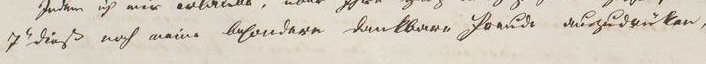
7t dieß noch meine besondere dankbare Freude auszudrücken,
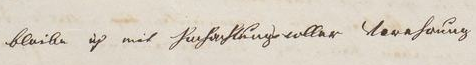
bleibe ich mit hochachtungsvoller Verehrung
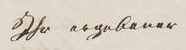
Ihr ergebener
